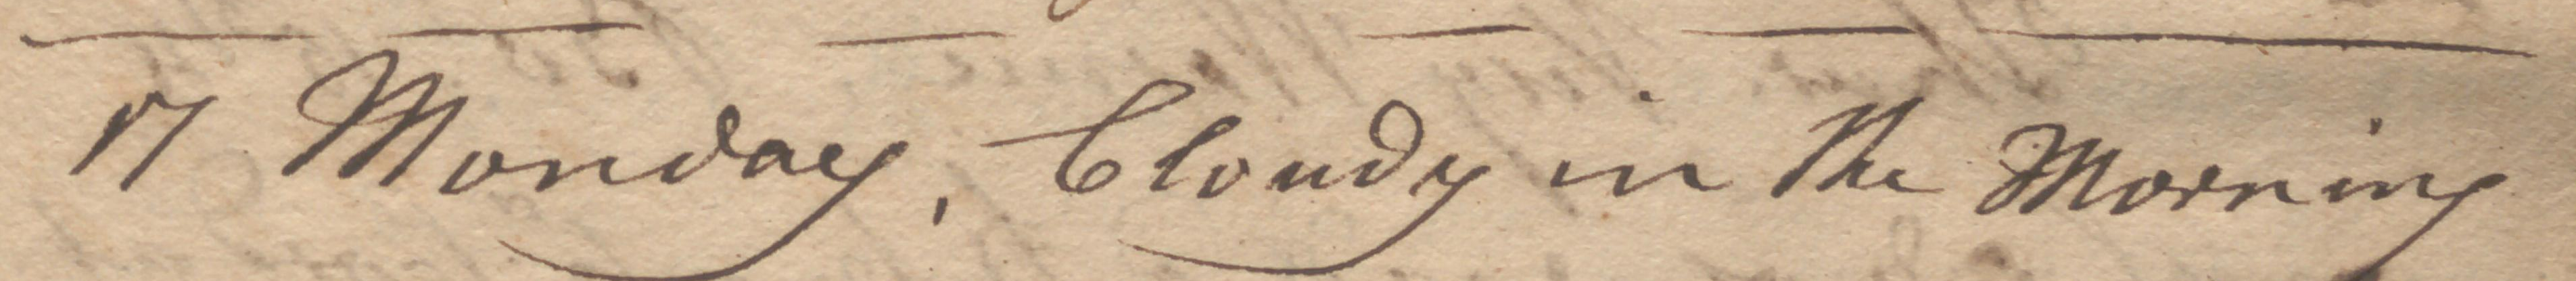17 Monday. Cloudy in the Mornig
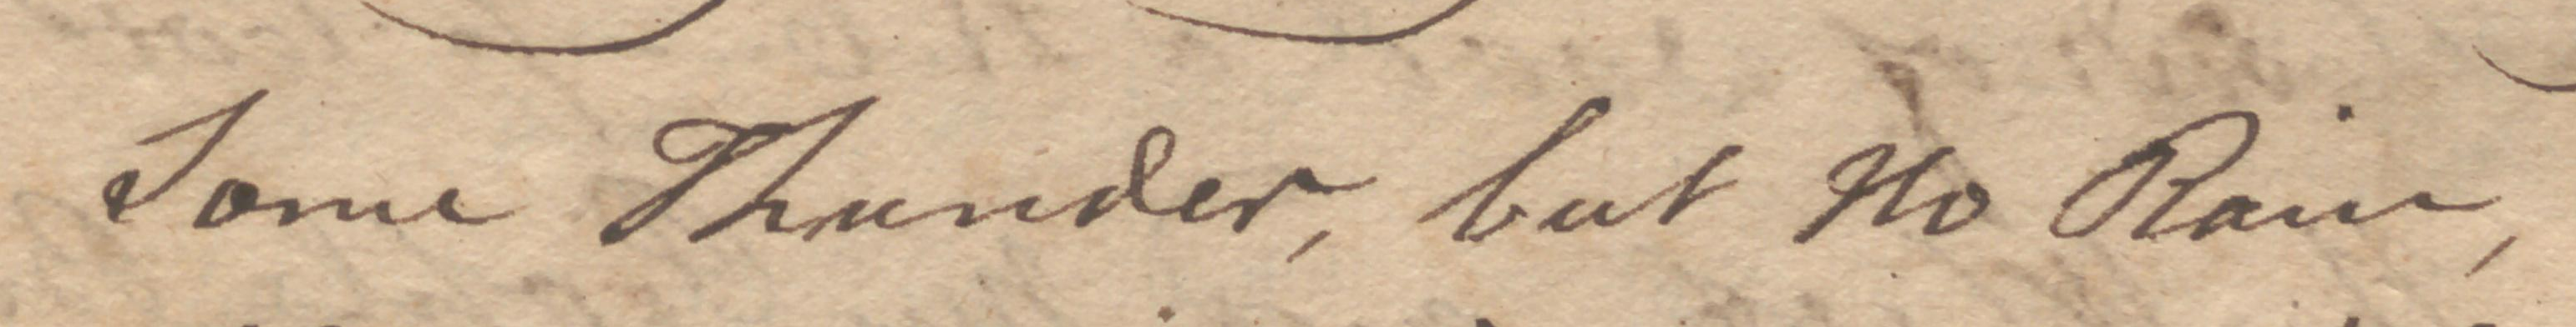some Thunder, but no Rain
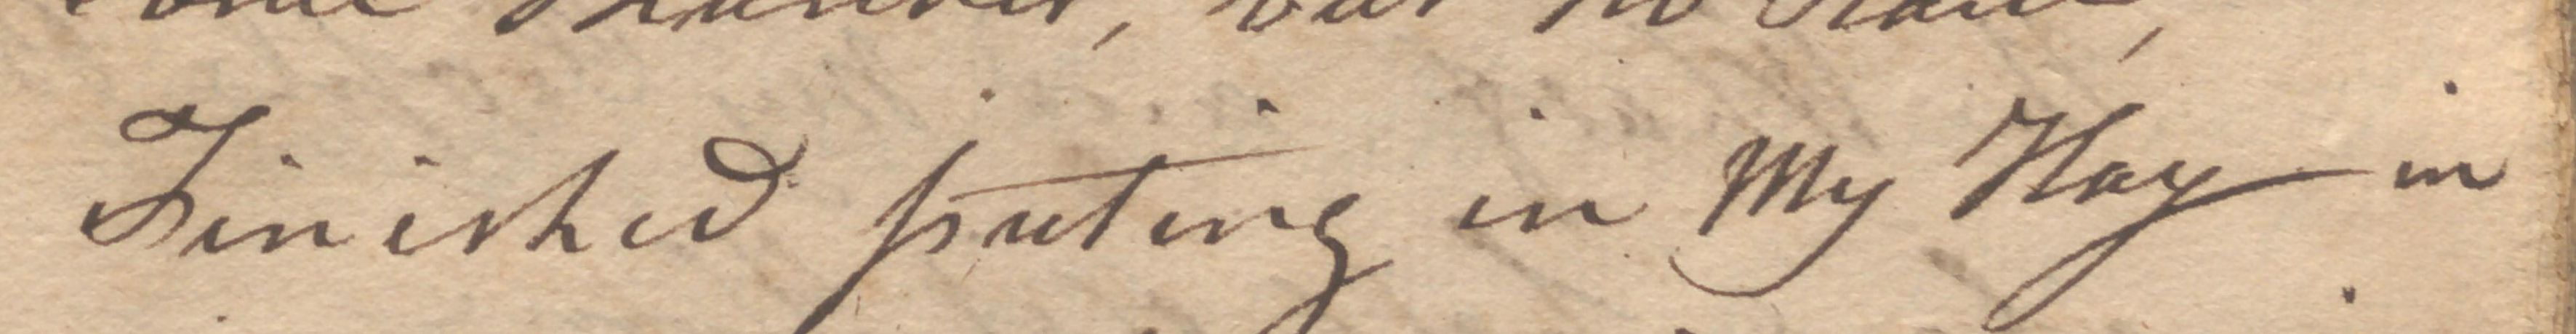Finished puting in My Hay in
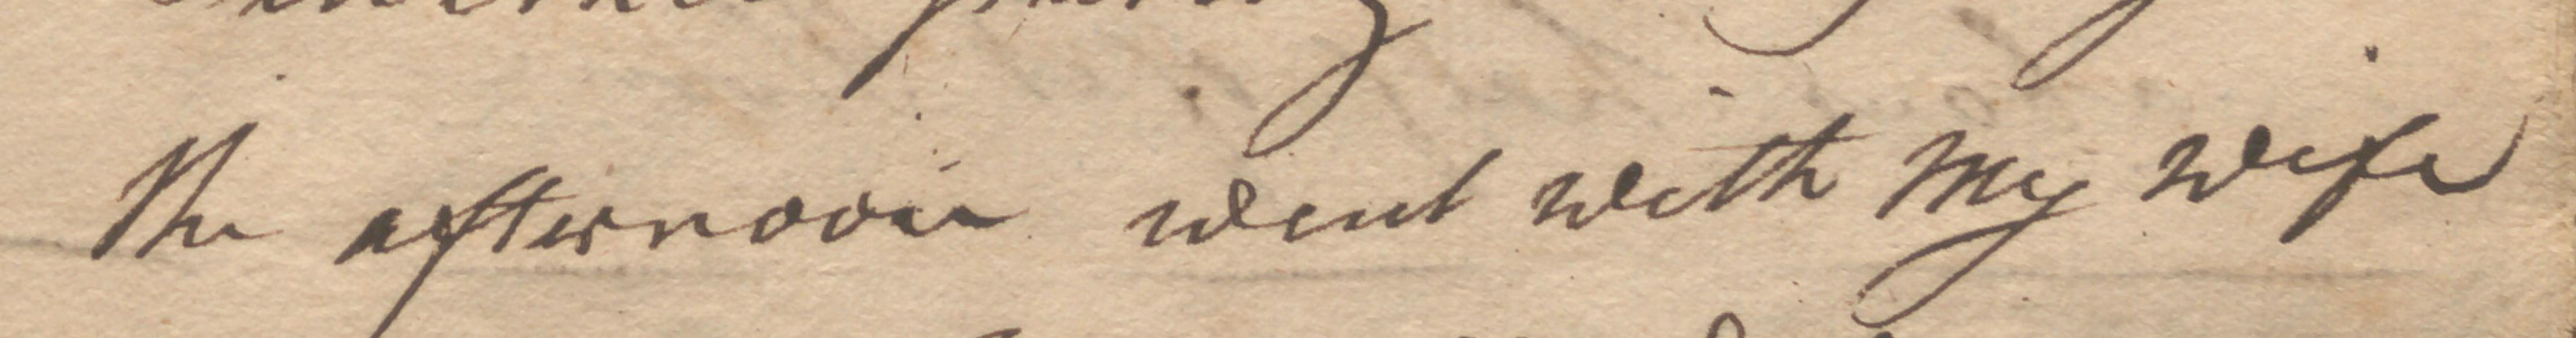the afternoon went with My wife
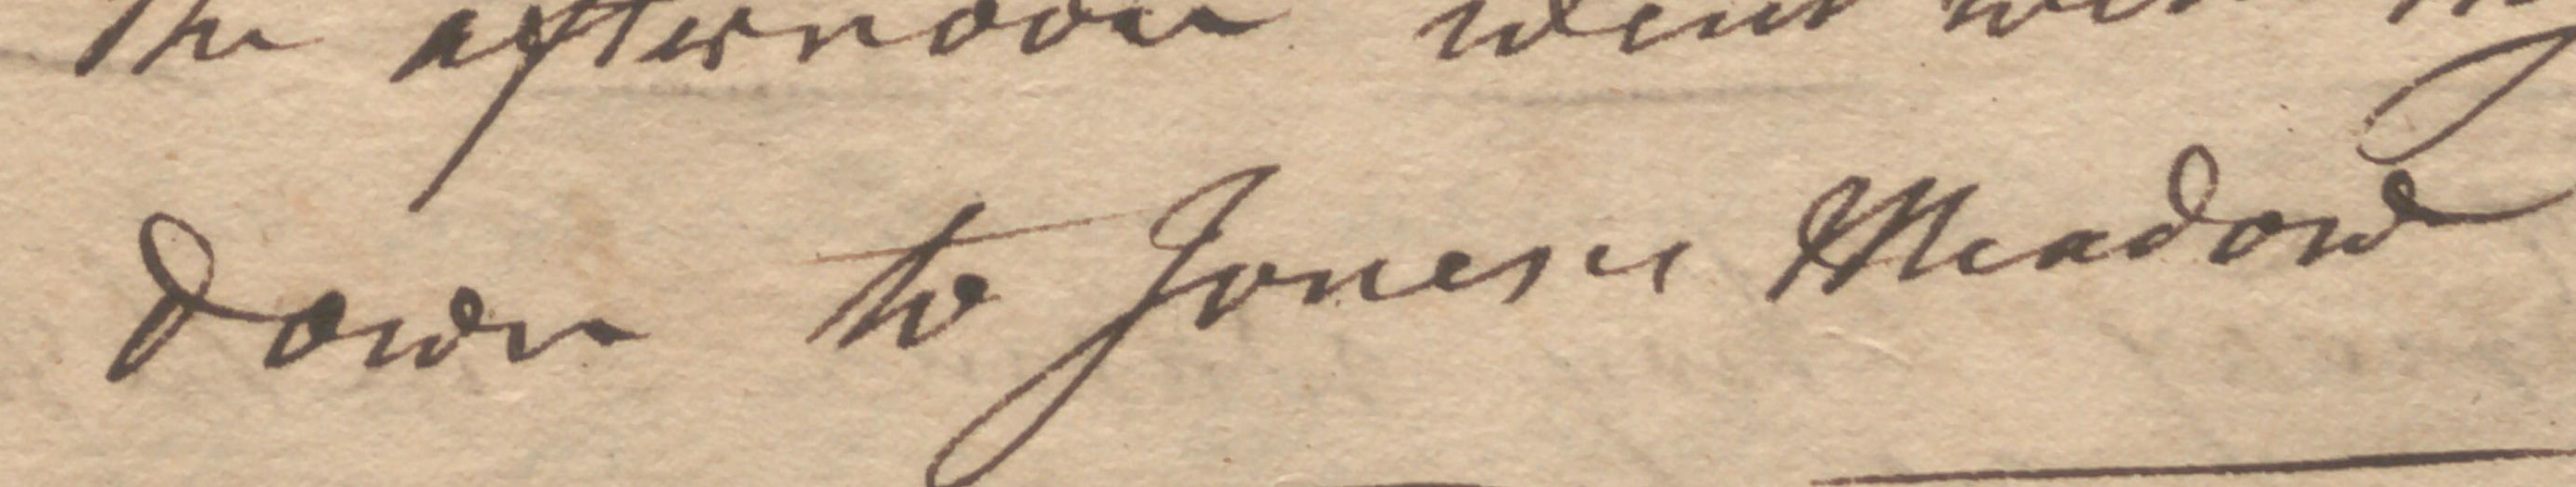down to Joneses Meadow
